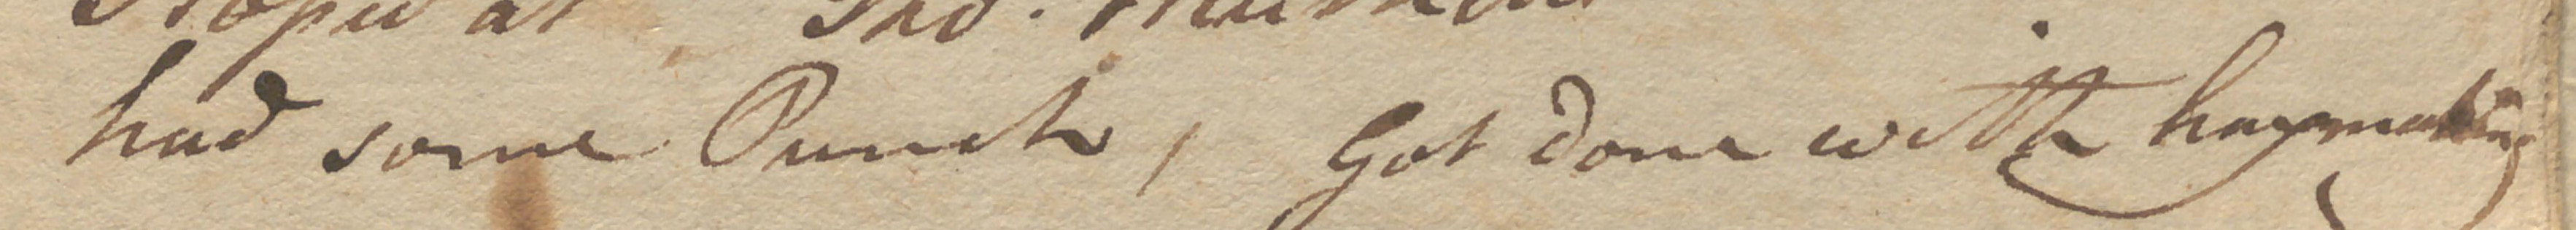had some Punch, Got done with haymaking
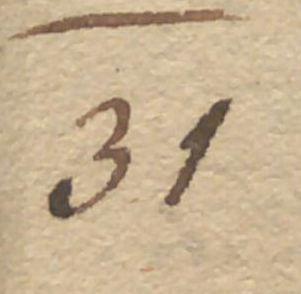31
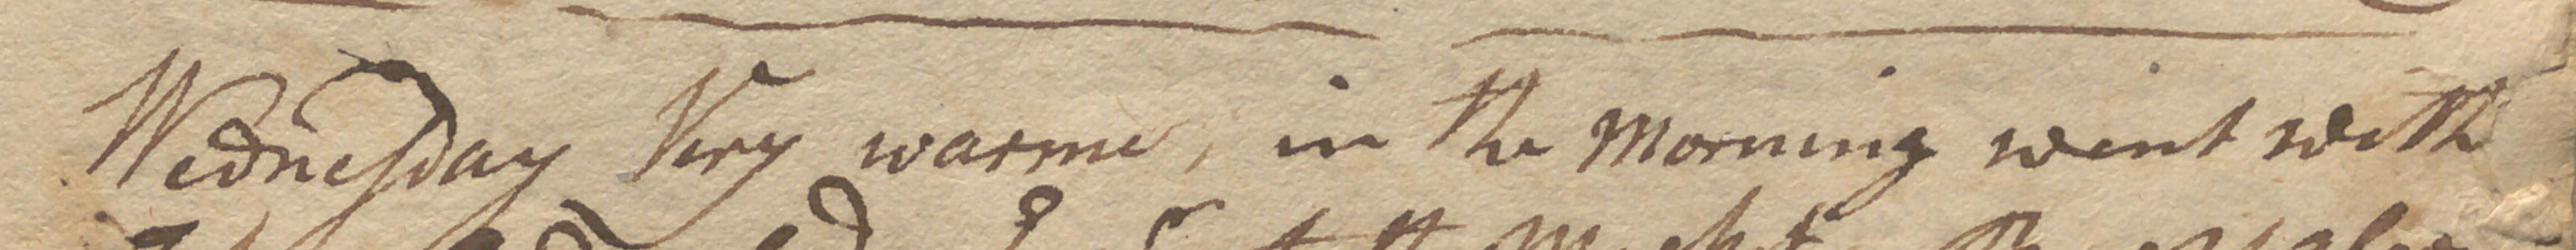Wednesday Very warme, in the morning went with
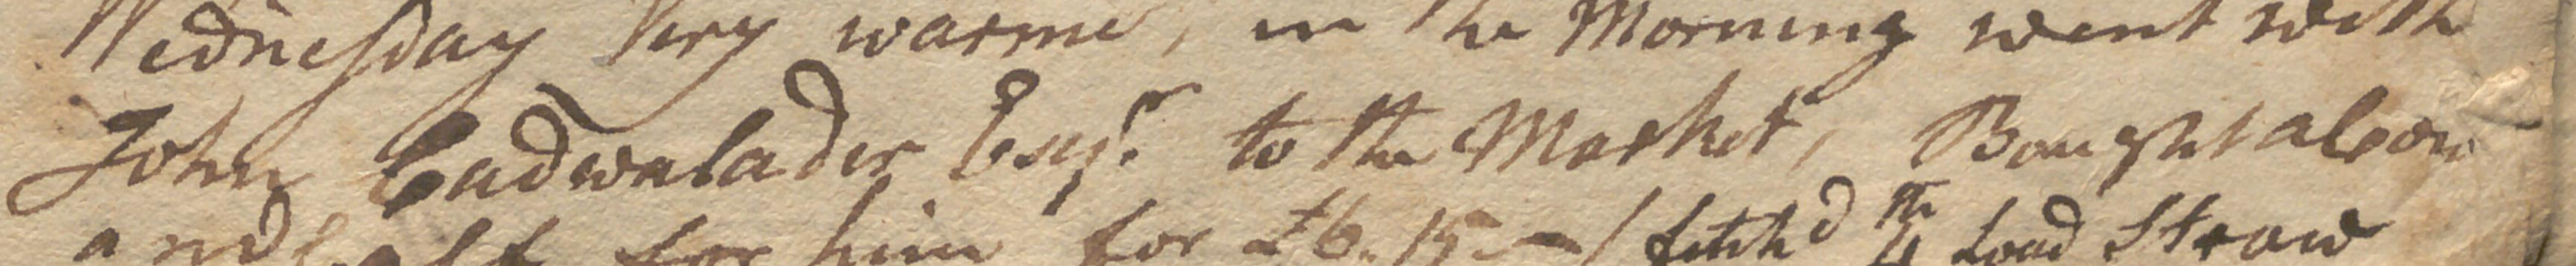Johe Cadwalader Esq^r. to the Market, Bought a Cow
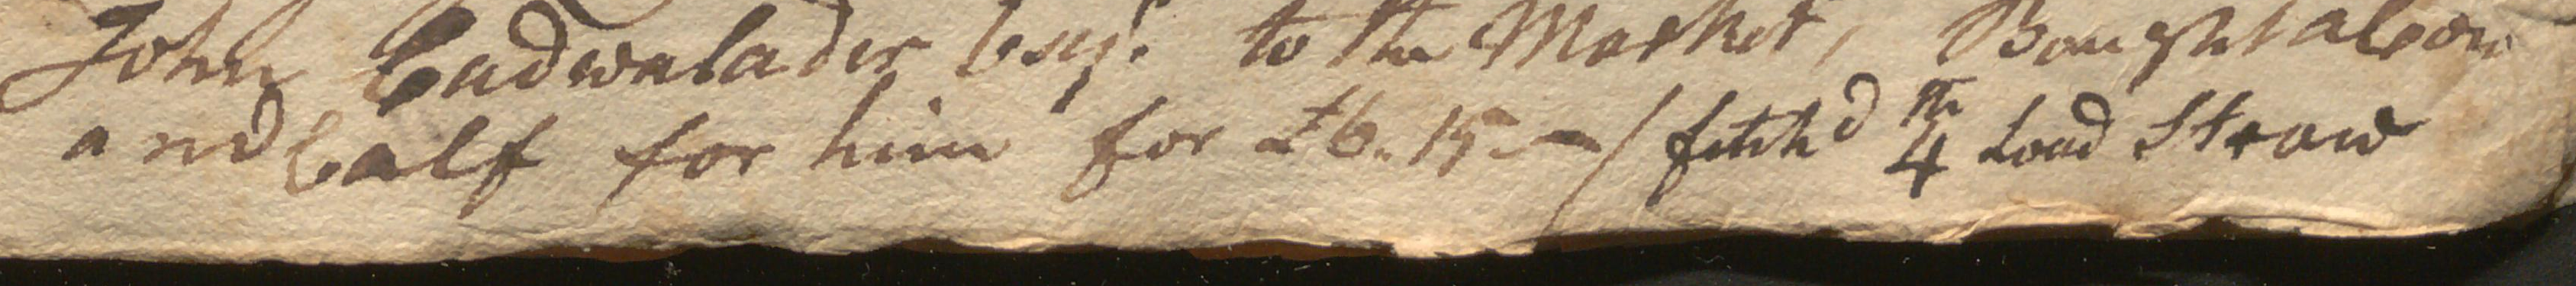and Calf for him for £6..15-s fetch^d 4^th Load Straw
